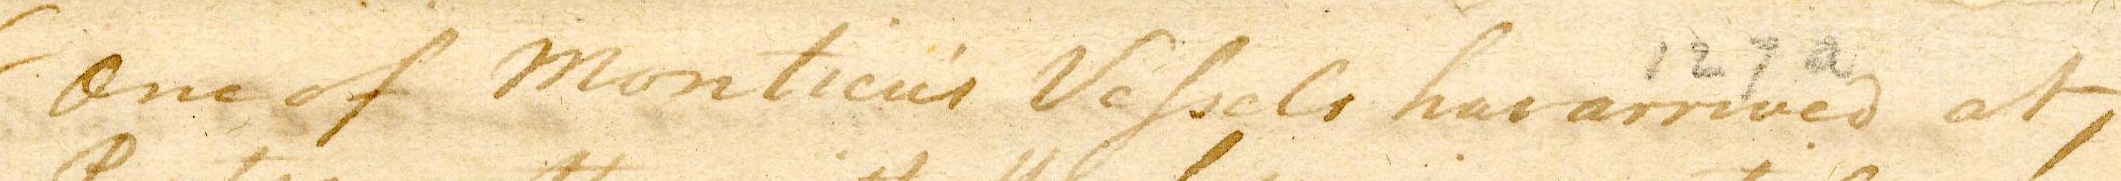One of Monticu's Vessels has arrived at
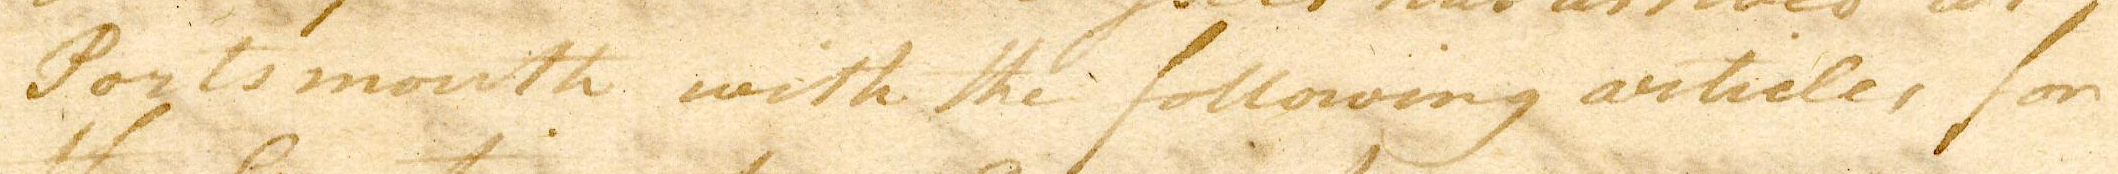Portsmouth with the following articles for
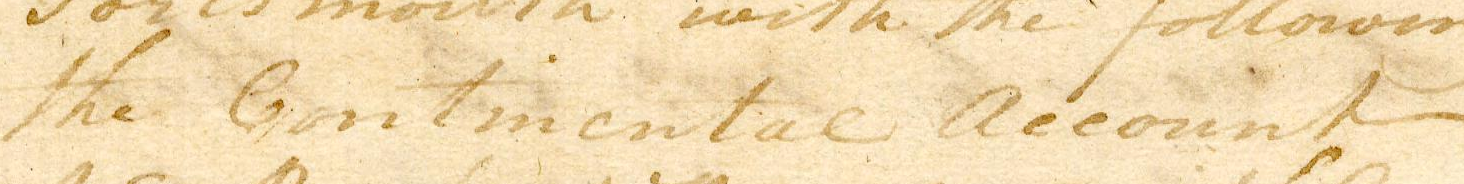the Continental Account
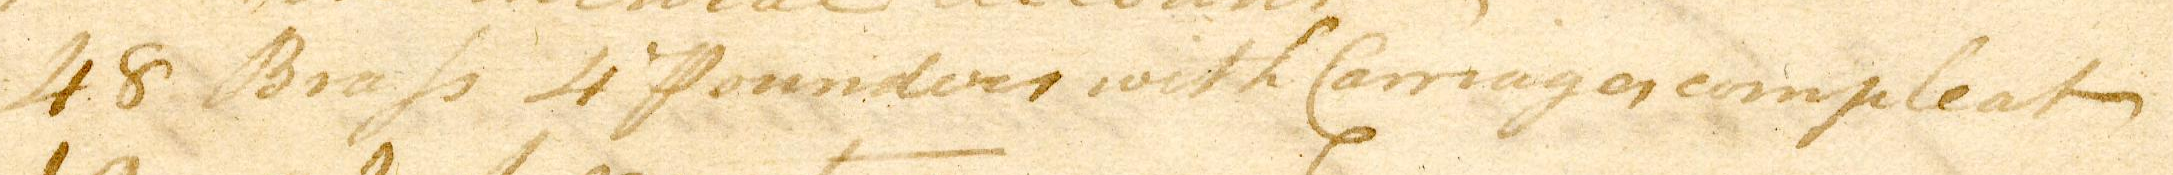48 Brass 4 Pounders with Carriages compleat
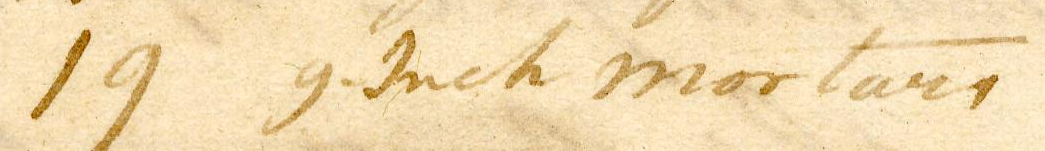19 9^e Inch Mortars
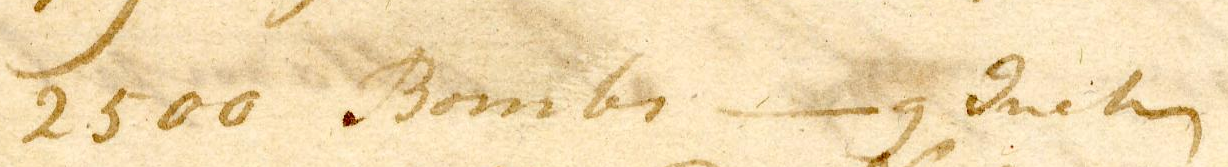2500 Bombs-9 Inch
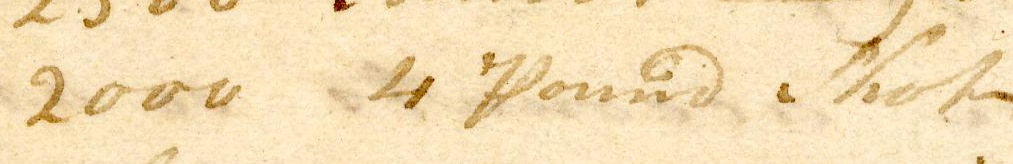2000 4 Pound shot
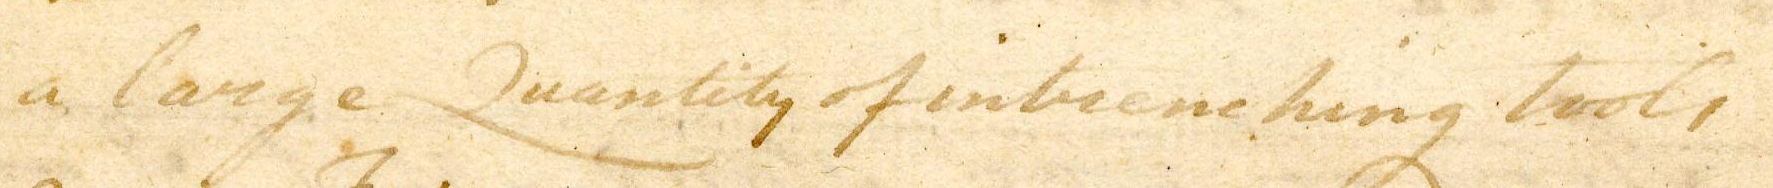a large Quantity of intrenching tools
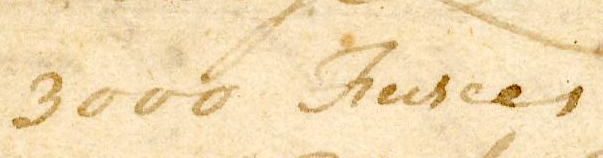3000 Fusces
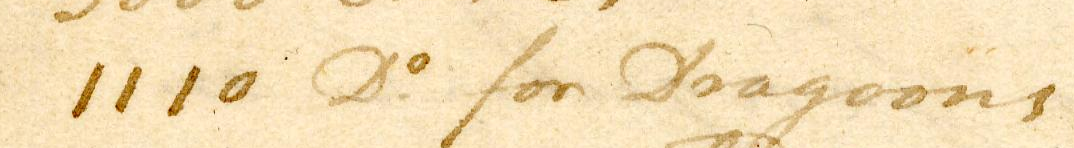1110 D^o. for Dragoons
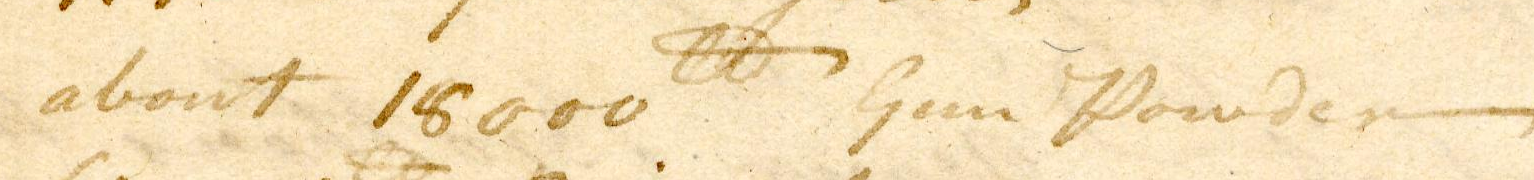about 16000 ^lb Gun Powder
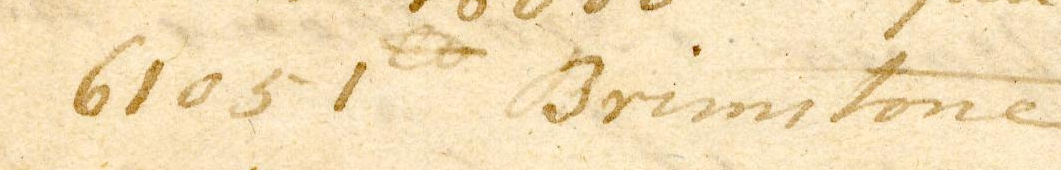61051 ^lb Brimstone
